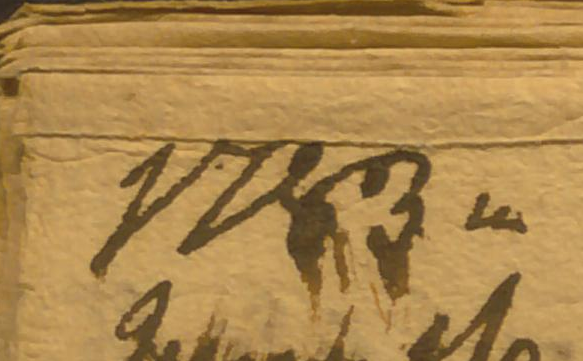1783
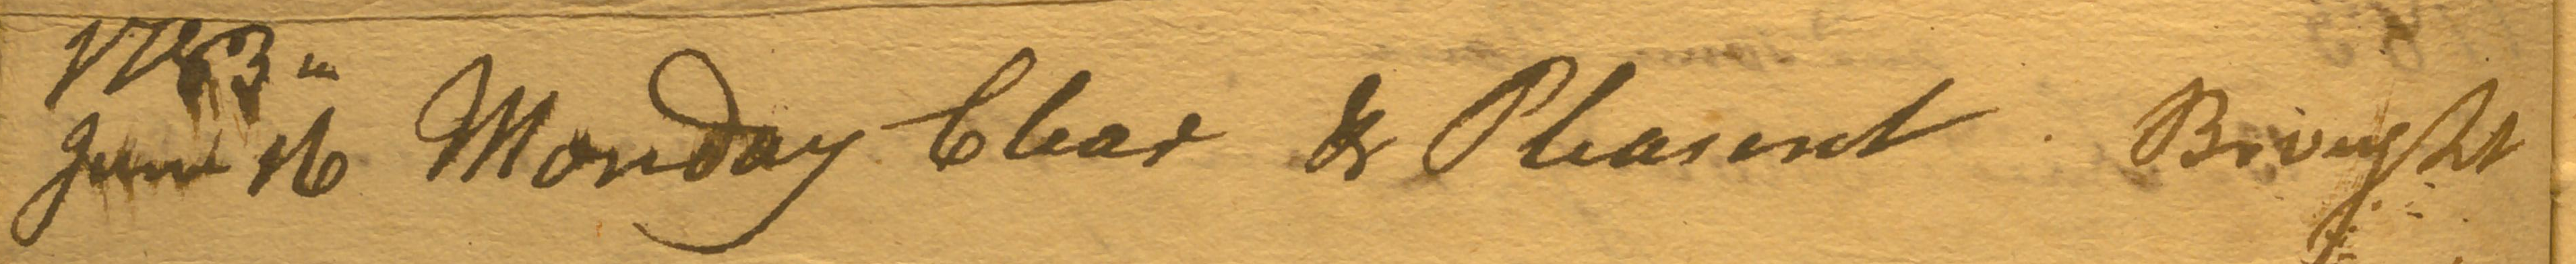June 16^th Monday Clear & Pleasent. Brought
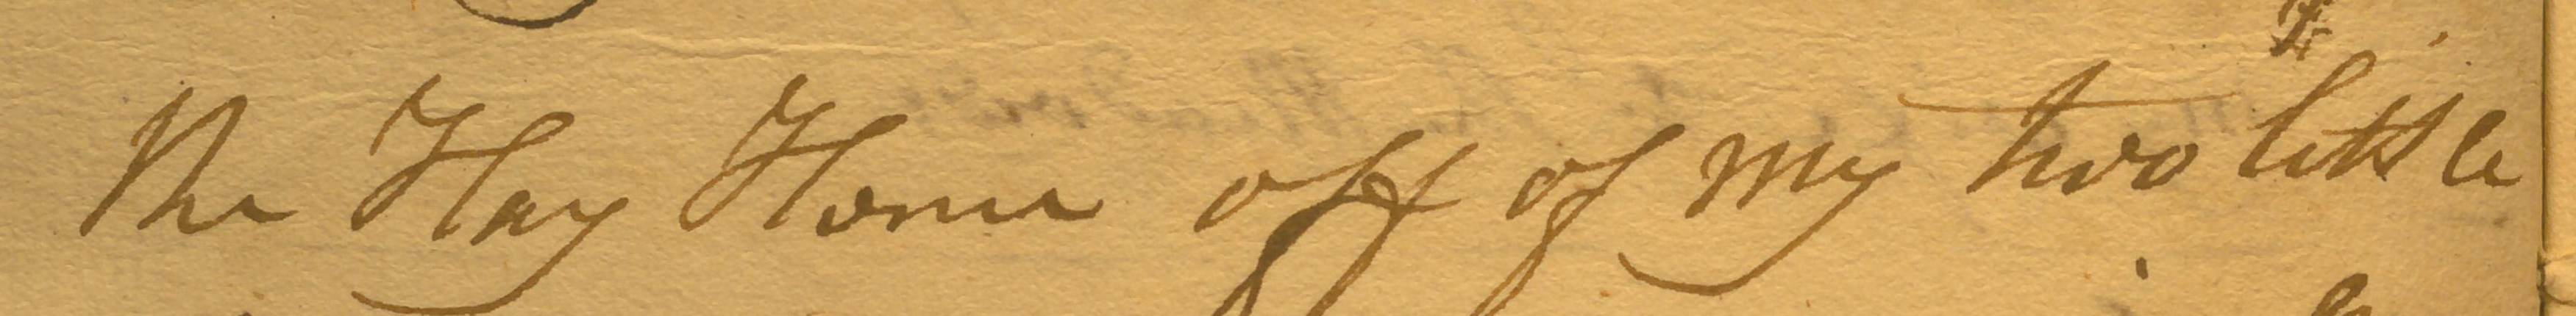the Hay Home off of my two little
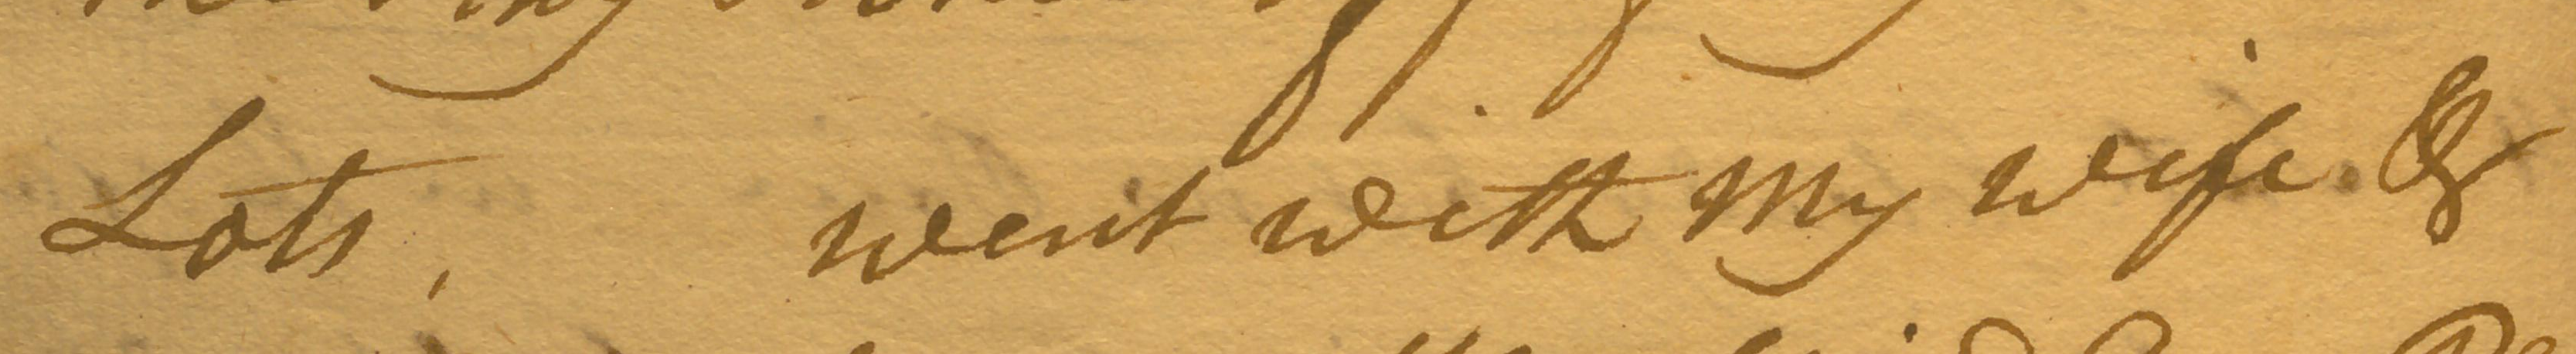Lots, went with my wife &
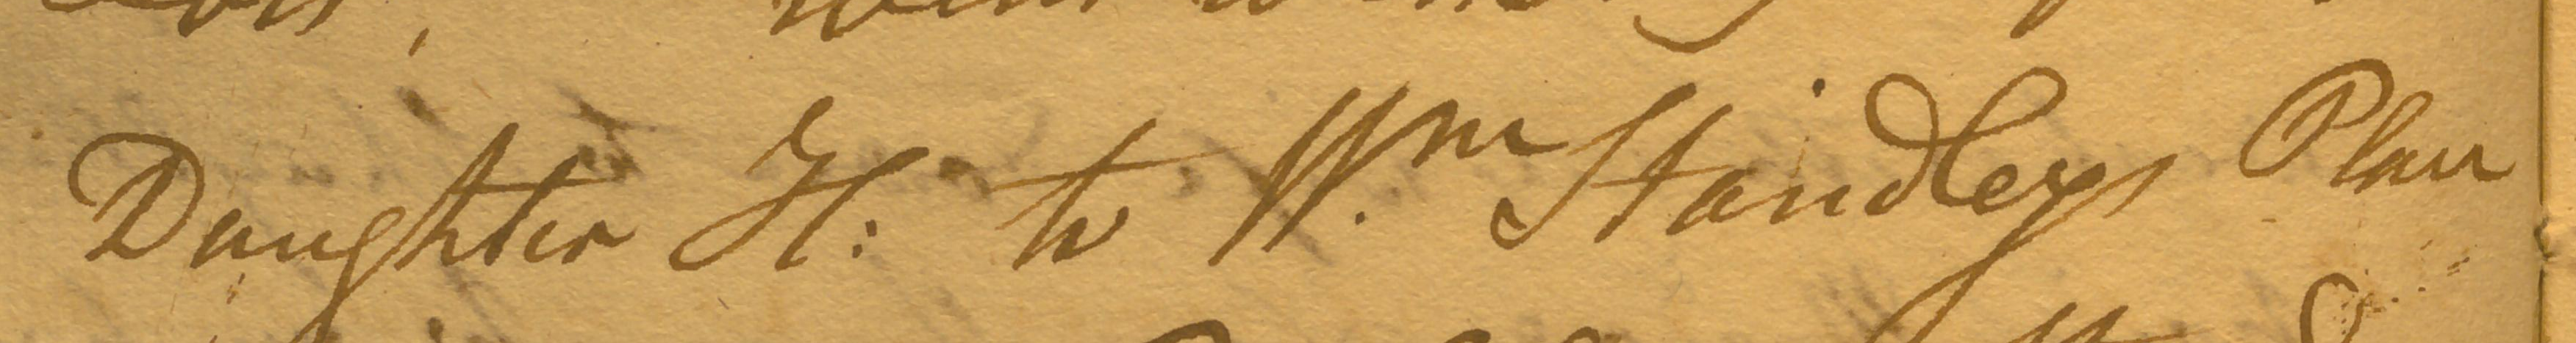Daughter H: to W^m. Standleys Place
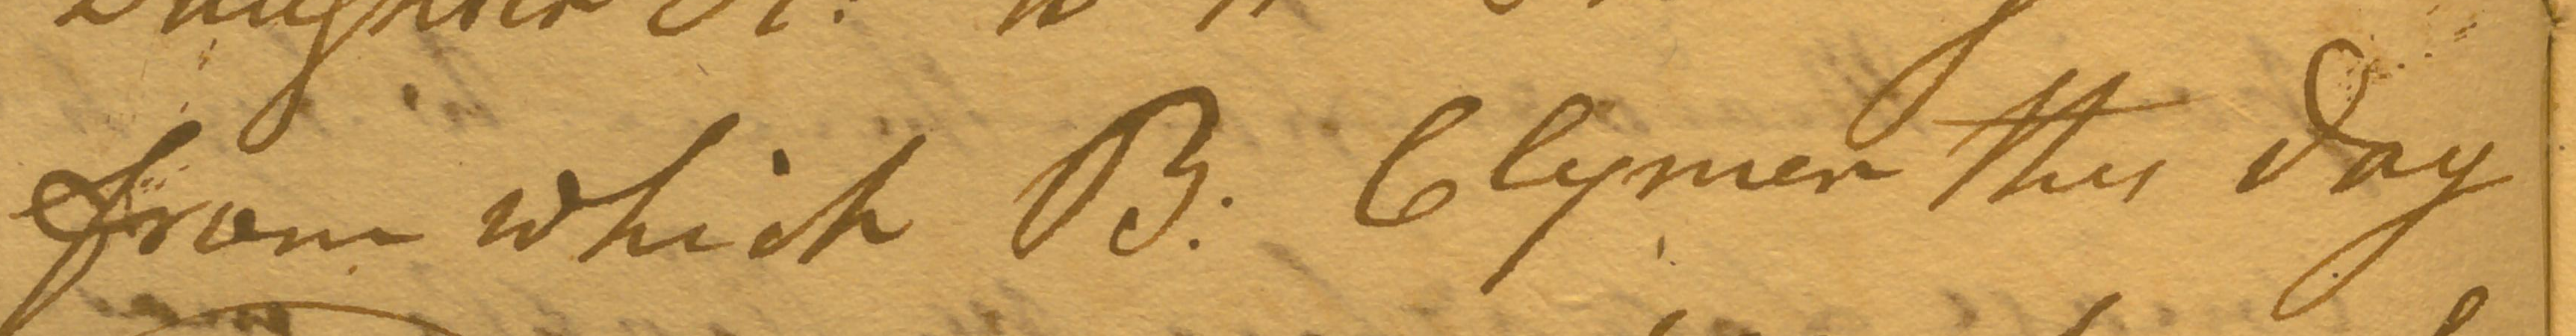from which B. Clymer this day
